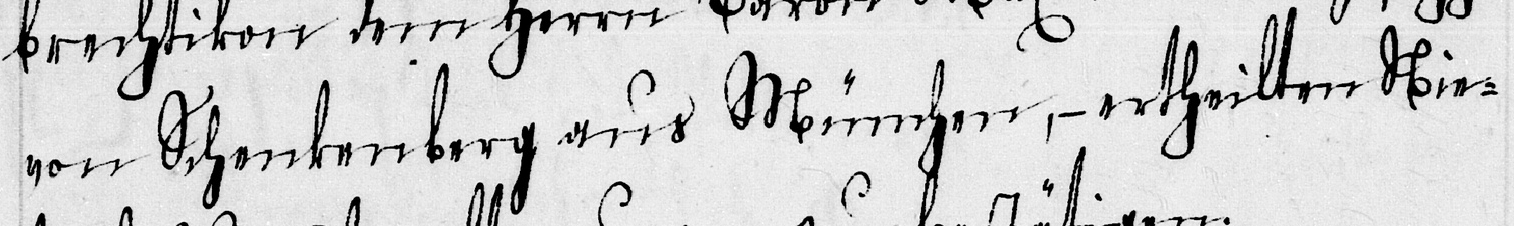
von Schenkenberg aus München, – ertheilten Nie¬
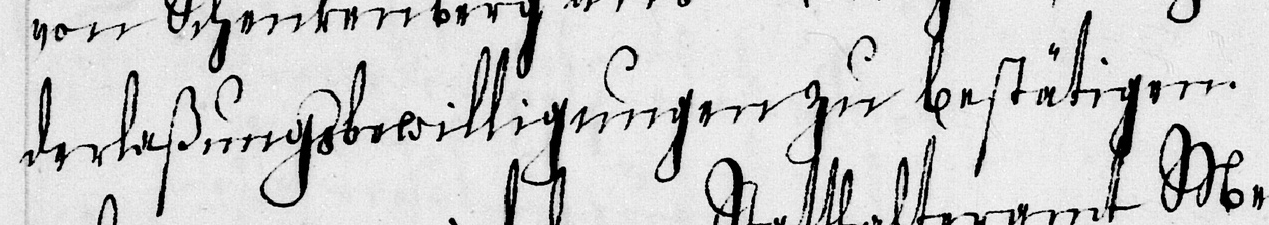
derlaßungsbewilligungen zu bestätigen.
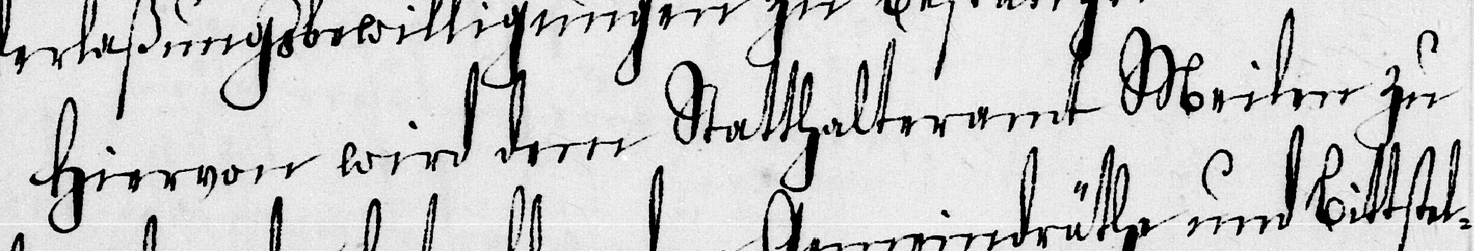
Hiervon wird dem Statthalteramt Meilen zu
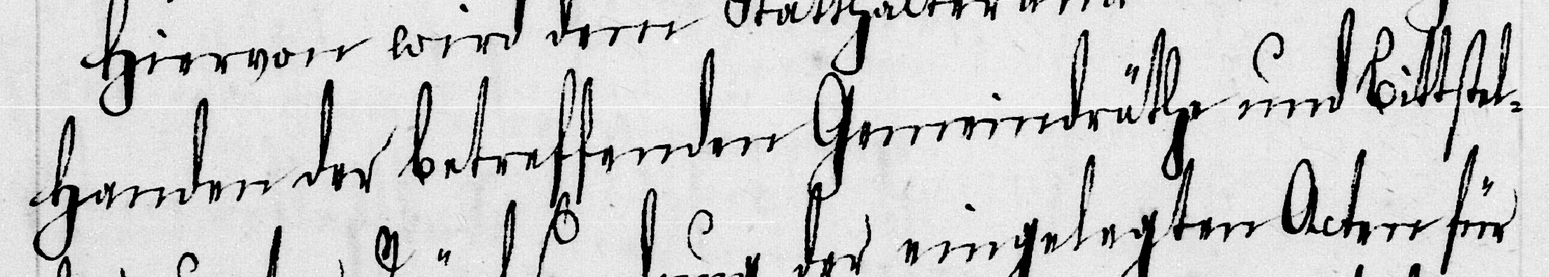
Handen der betreffenden Gemeindräthe und Bitt¬
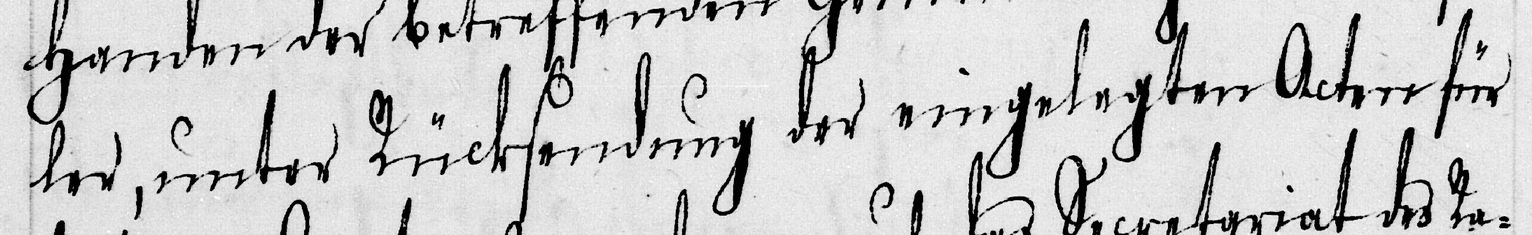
ler, unter Rücksendung der eingelegten Acten für
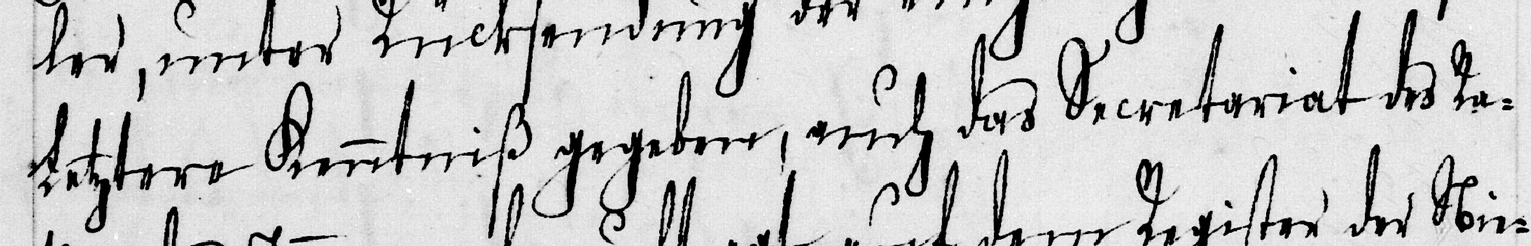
Letztere Kenntniß gegeben, auch das Secretariat des Ra¬
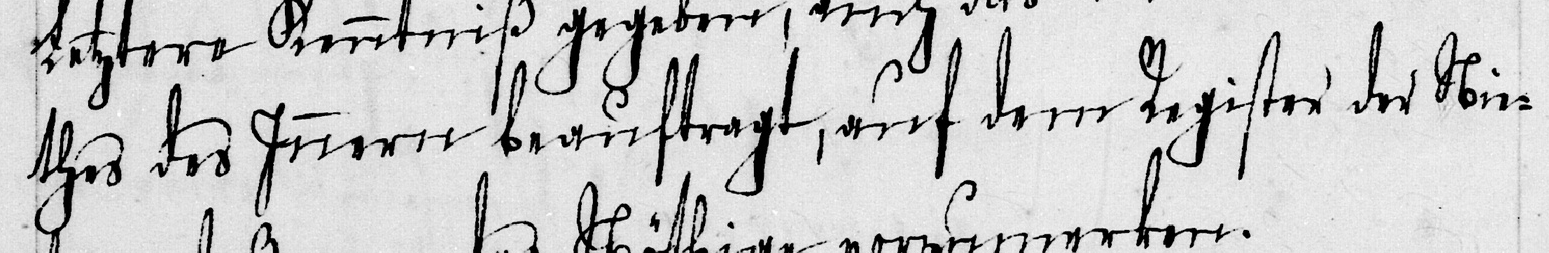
thes des Innern beauftragt, auf dem Register der Nie¬
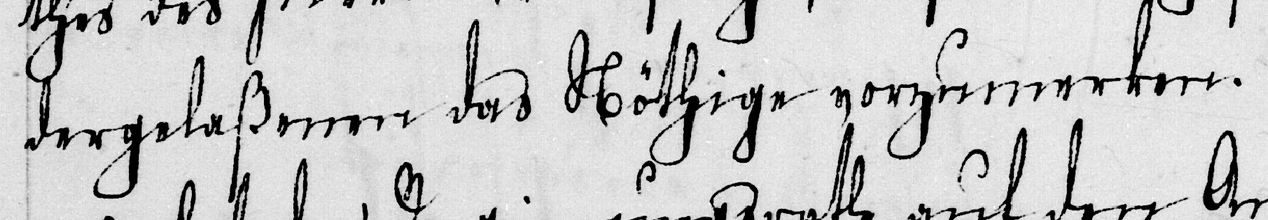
dergelaßenen das Nöthige vorzumerken.
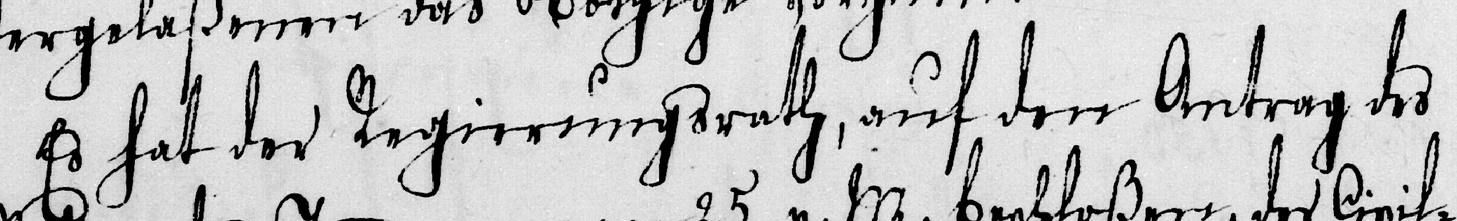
Es hat der Regierungsrath, auf den Antrag der
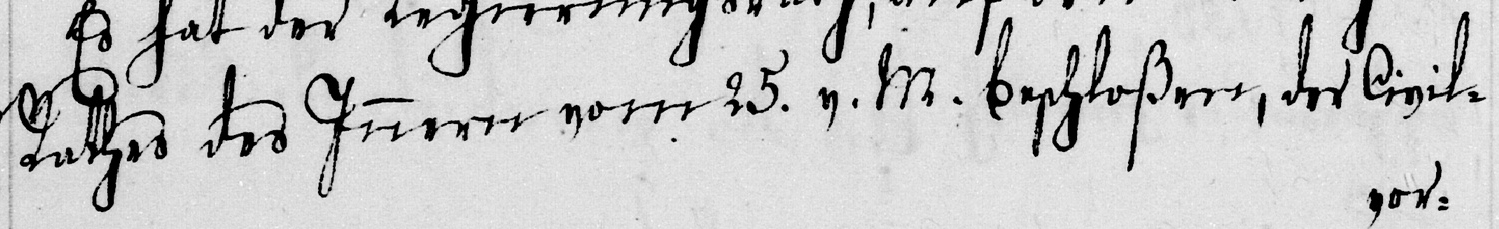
Rathes des Innern vom 25. v. M. beschloßen, der Civil-
